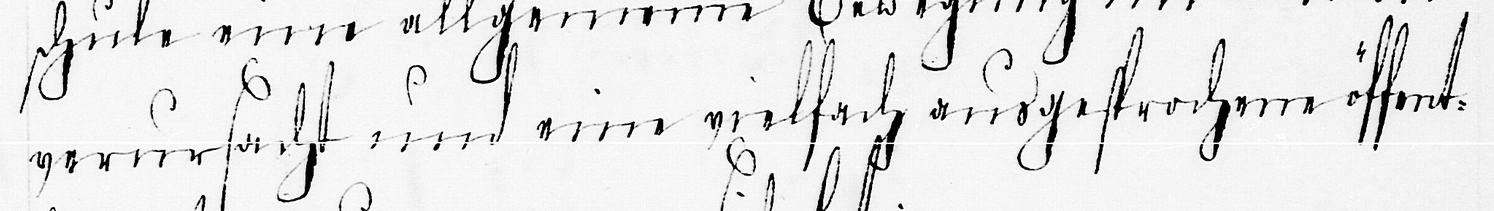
verursacht und eine vielfach ausgesprochene öffent¬
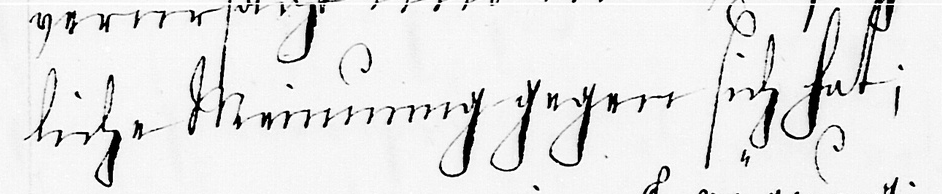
liche Meinung gegen sich hat;
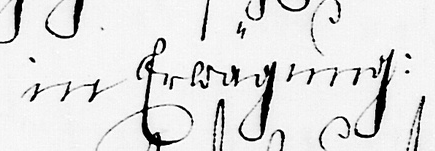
in Erwägung:
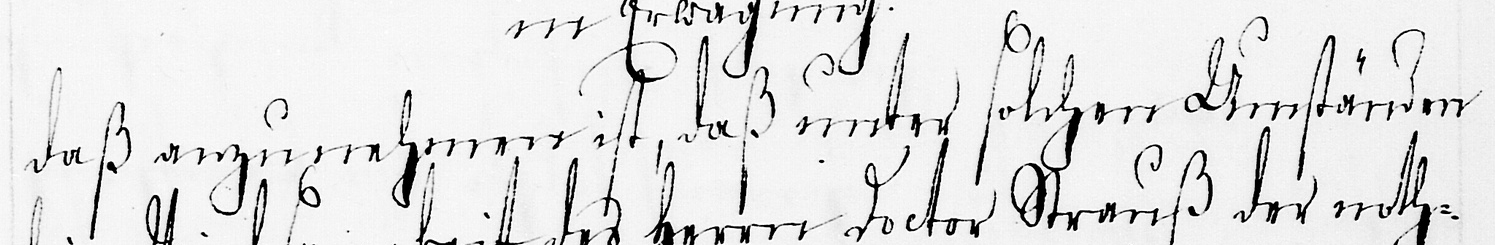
daß anzunehmen ist, daß unter solchen Umständen
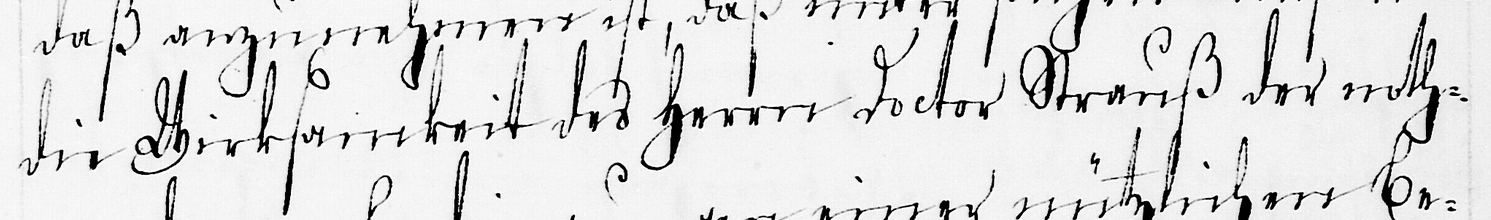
die Wirksamkeit des Herrn Doctor Strauß der noth¬
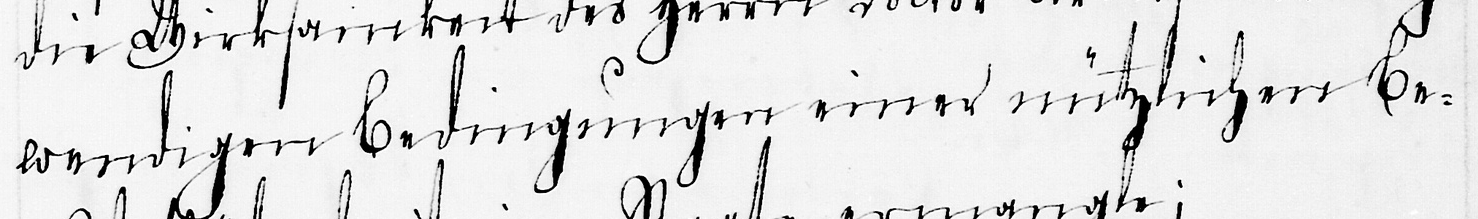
wendigen Bedingungen einer nützlichen Be¬
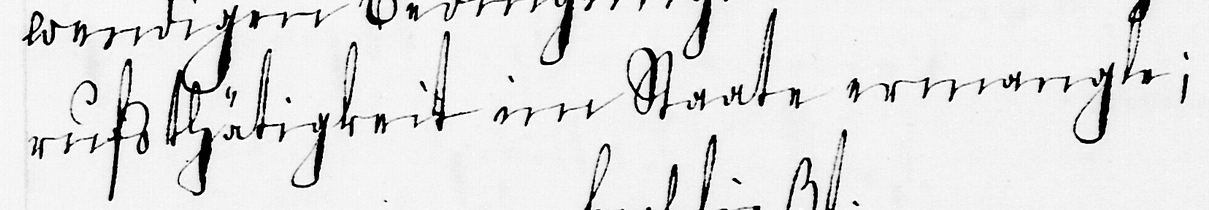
rufsthätigkeit im Staate ermangle;
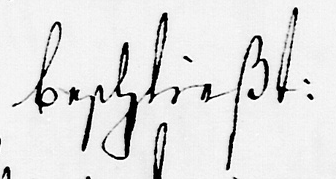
beschließt:
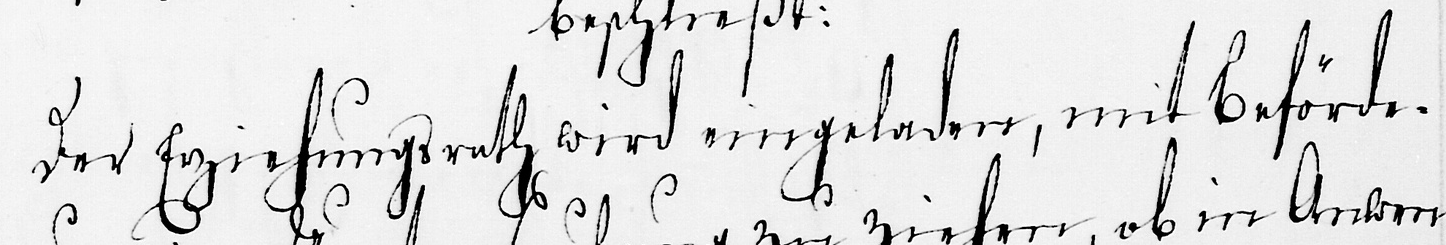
Der Erziehungsrath wird eingeladen, mit Beförde¬
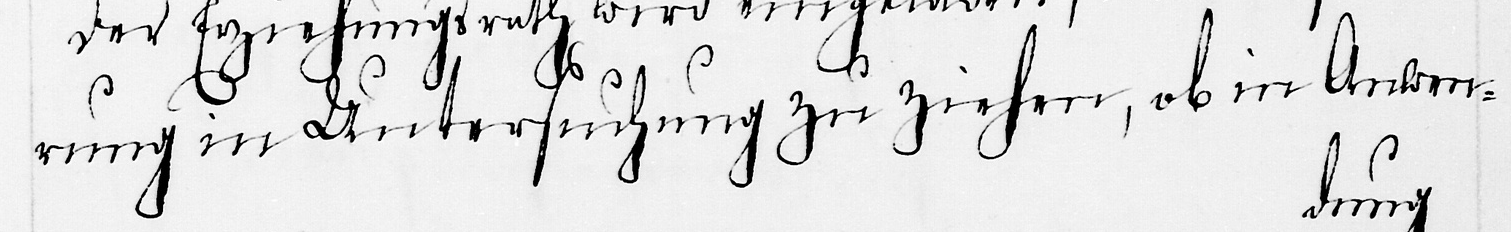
rung in Untersuchung zu ziehen, ob in Anwen-
